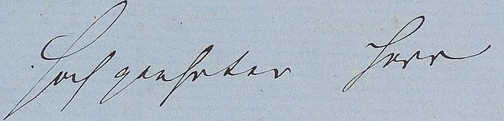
Hochgeehrter Herr
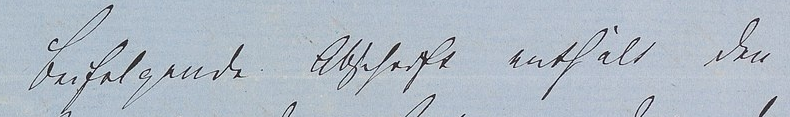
Beifolgende Abschrift enthält den
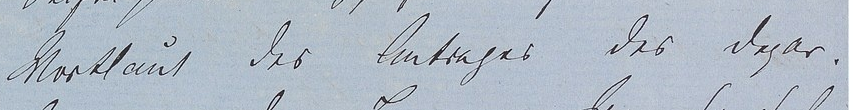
Wortlaut des Antrages des Depar-
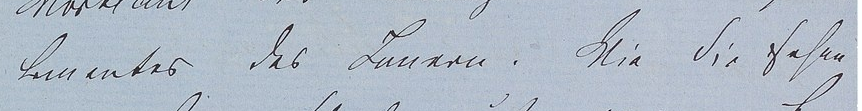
tementes des Innern. Wie Sie sehen
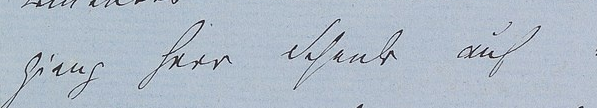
gieng Herr Schenk auf meine
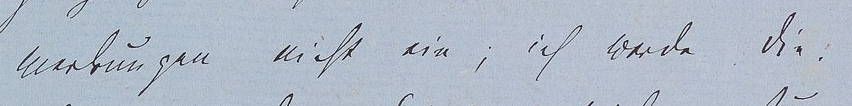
merkungen nicht ein; ich werde die-
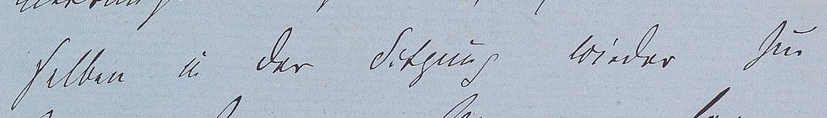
selben in der Sitzung wieder zur
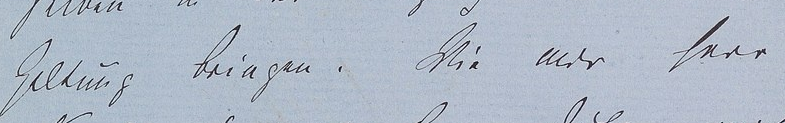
Geltung bringen. Wie mir Herr
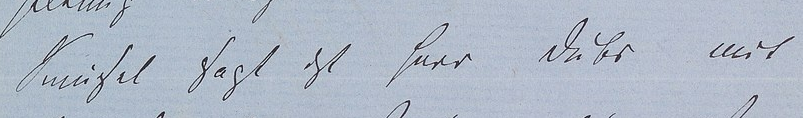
Knüsel sagt ist Herr Dubs mit
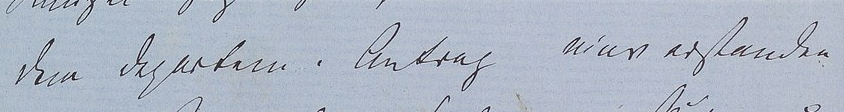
dem departem. Antrag einverstanden
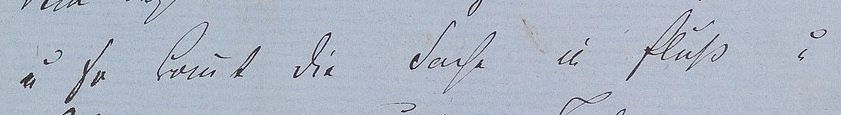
u so kommt die Sache in Fluß u
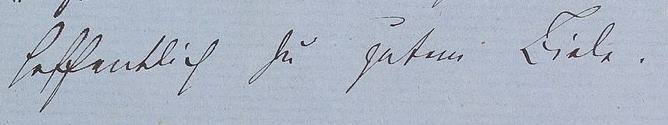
hoffentlich zu gutem Ziele.
